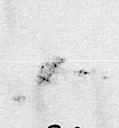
n¬
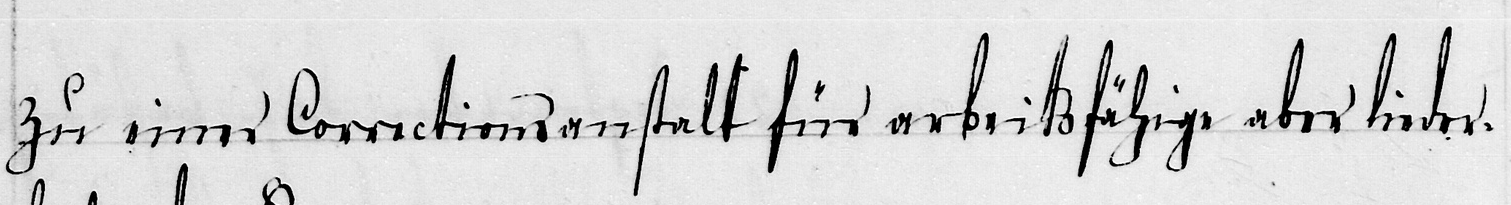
zu einer Correctionsanstalt für arbeitsfähige aber liede¬
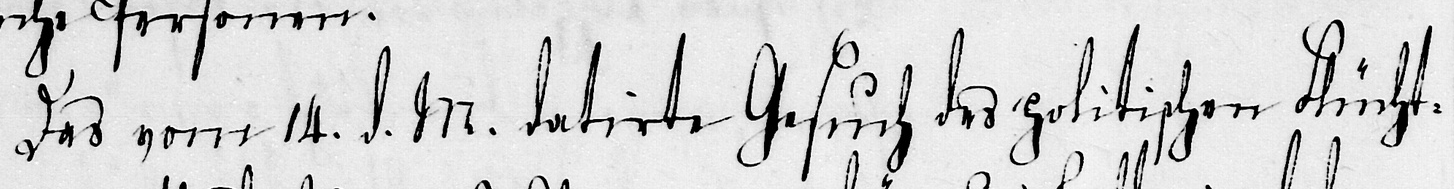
Das vom 14. d. M. datirte Gesuch des politischen Flücht¬
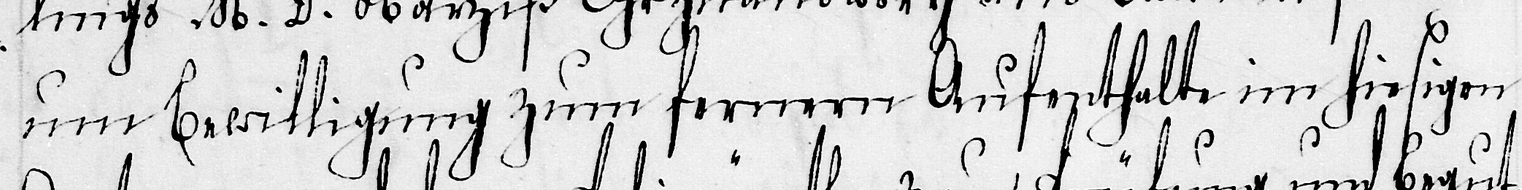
um Bewilligung zum fernern Aufenthalte im hiesigen
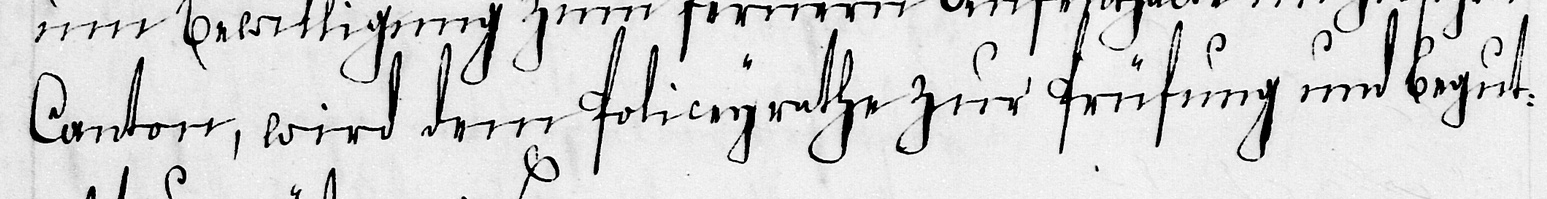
Canton, wird dem Policeyrathe zur Prüfung und Begut¬
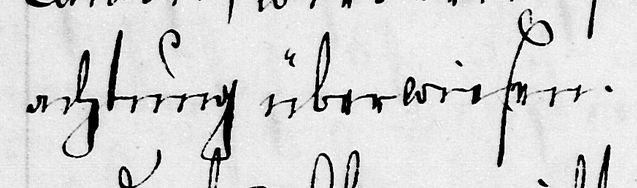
achtung überwiesen.
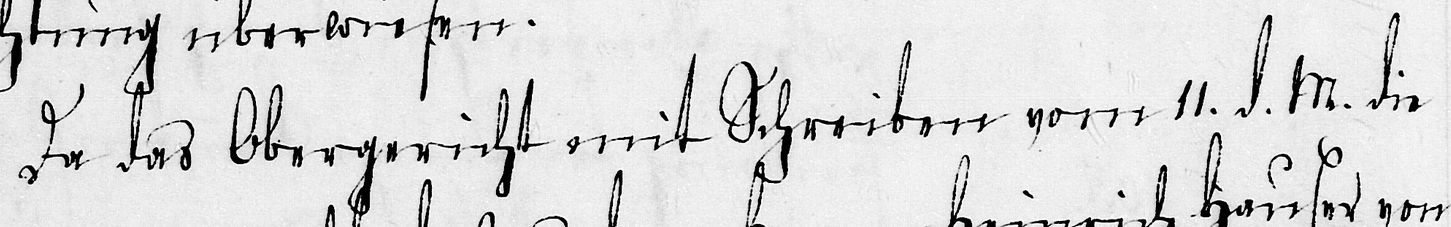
Da das Obergericht mit Schreiben vom 11. d. M. die
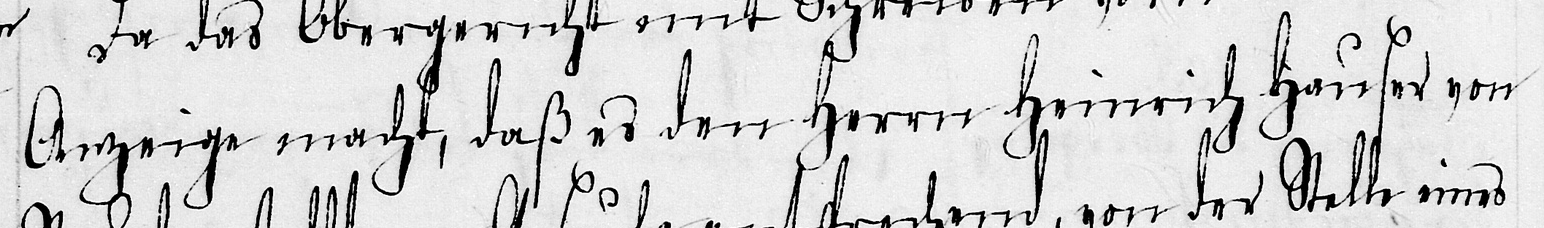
Anzeige macht, daß es den Herrn Heinrich Hauser von
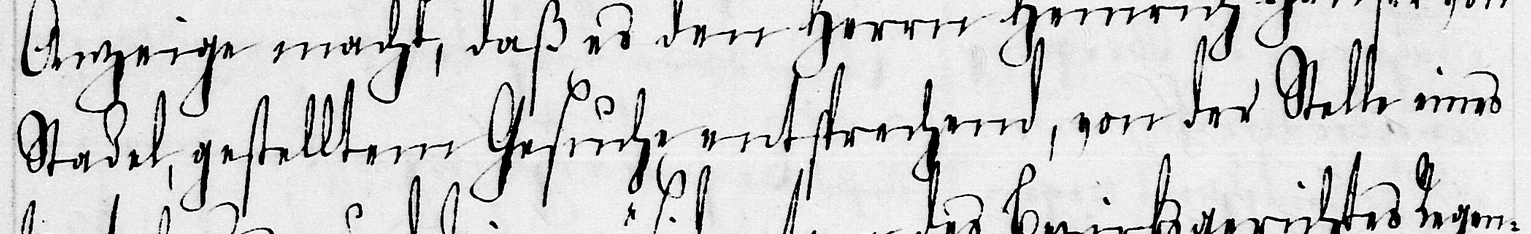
Stadel, gestelltem Gesuche entsprechend, von der Stelle eines
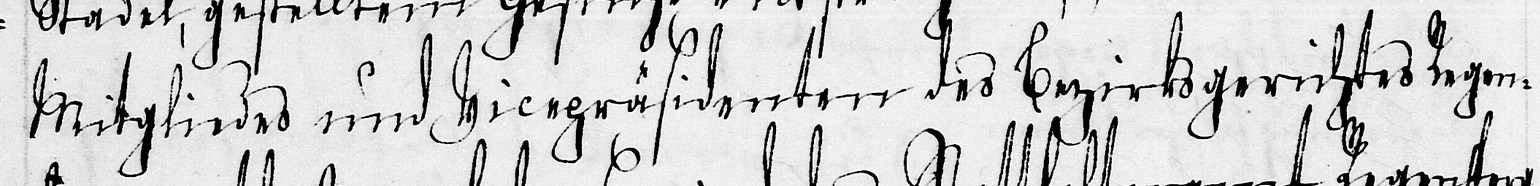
Mitgliedes und Vicepräsidenten des Bezirksgerichtes Rege¬
